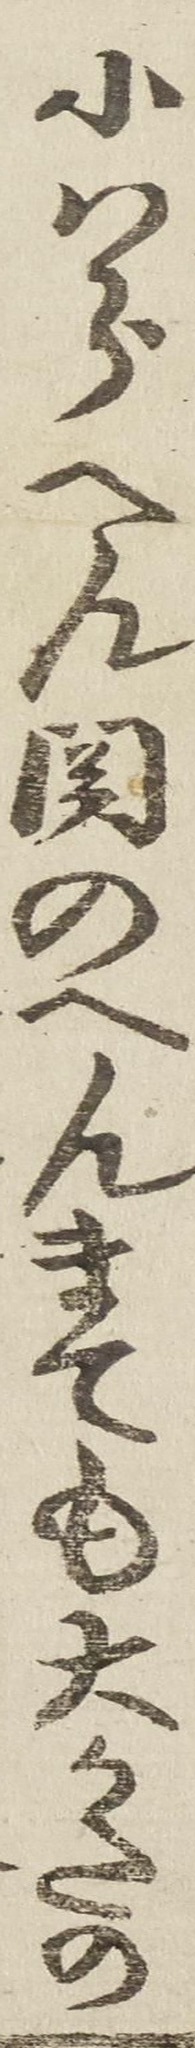小はらへん関のへんまても大かたの
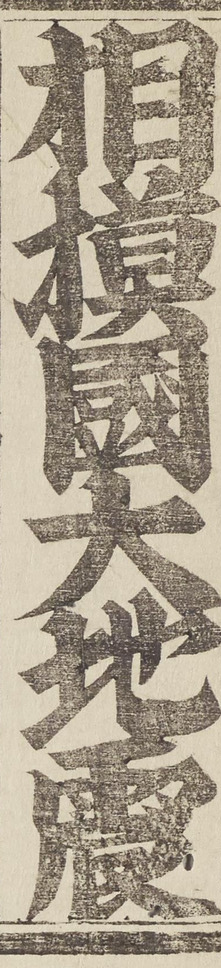相模国大地震
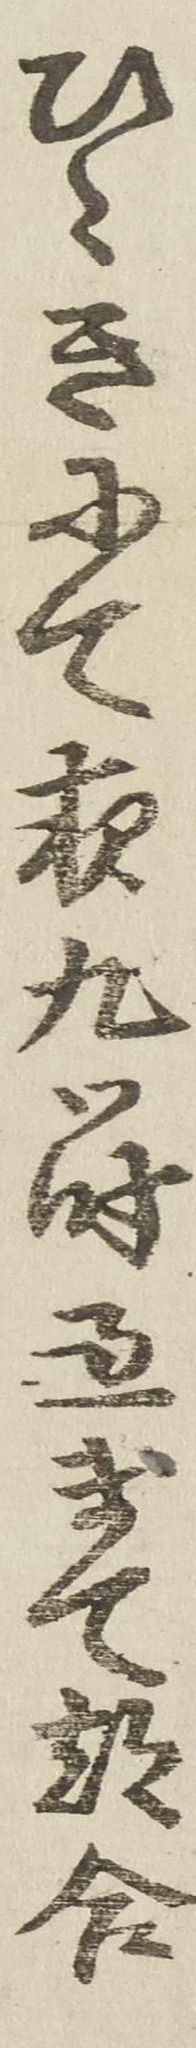ひゝきにて夜九ツ時過まで都合
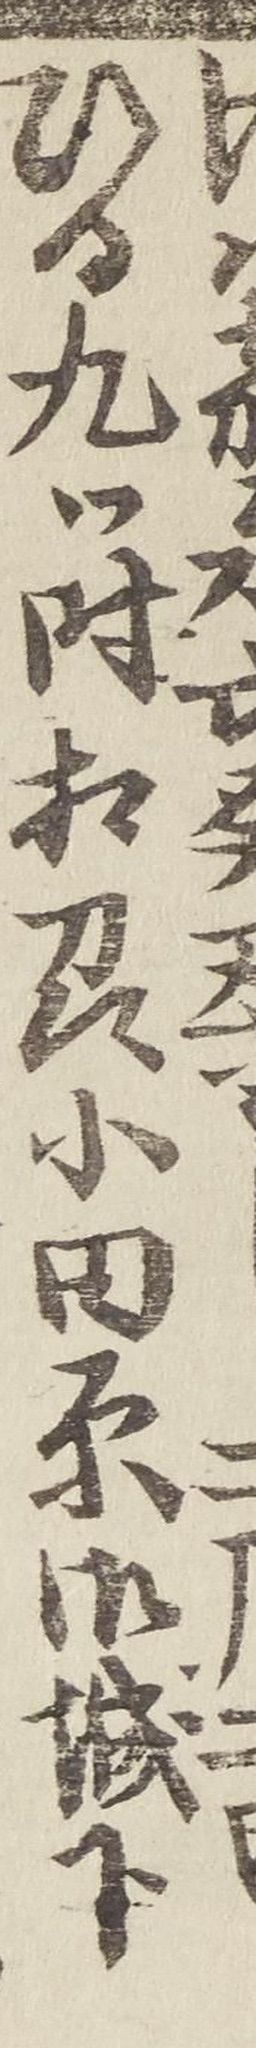ひる九ツ時相州小田原御城下
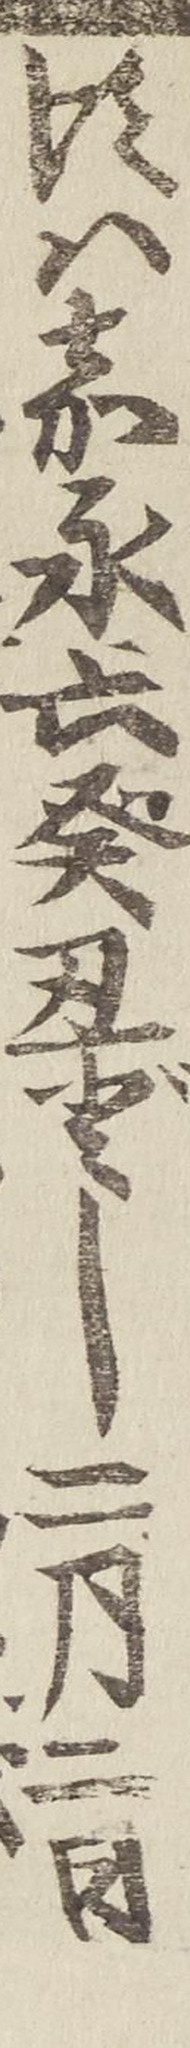頃は嘉永六癸丑どし二月二日
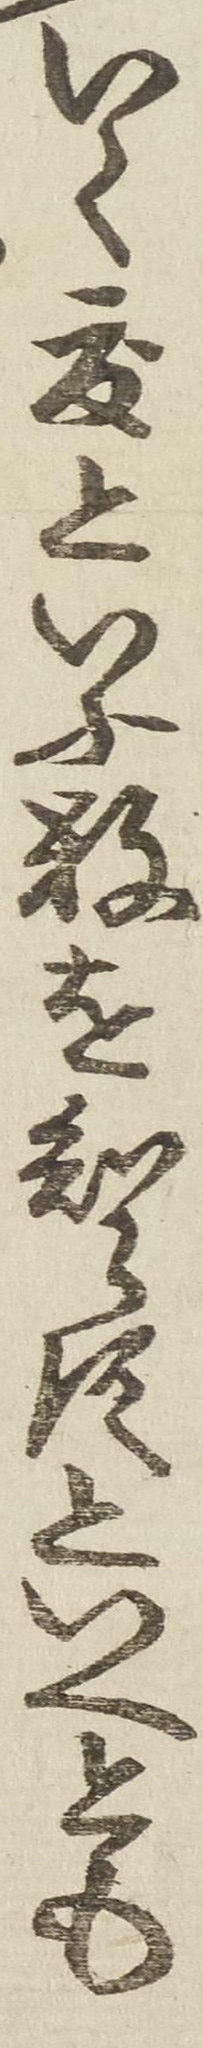いく度といふ数を知らずといへとも
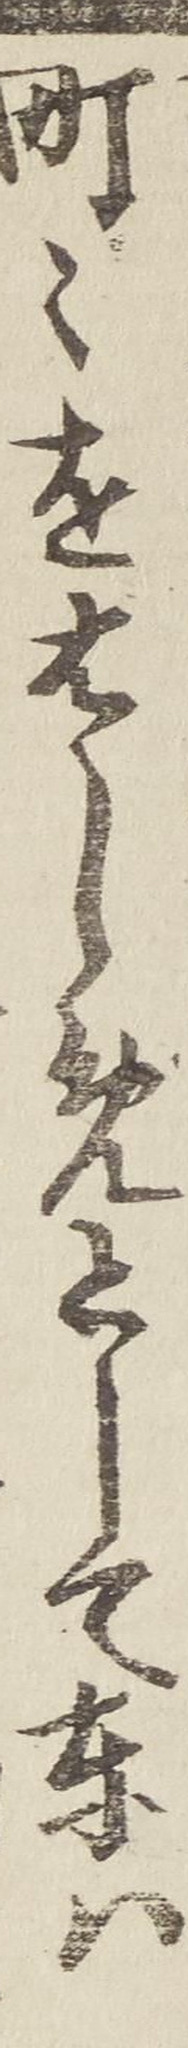町々をはしめとして東は
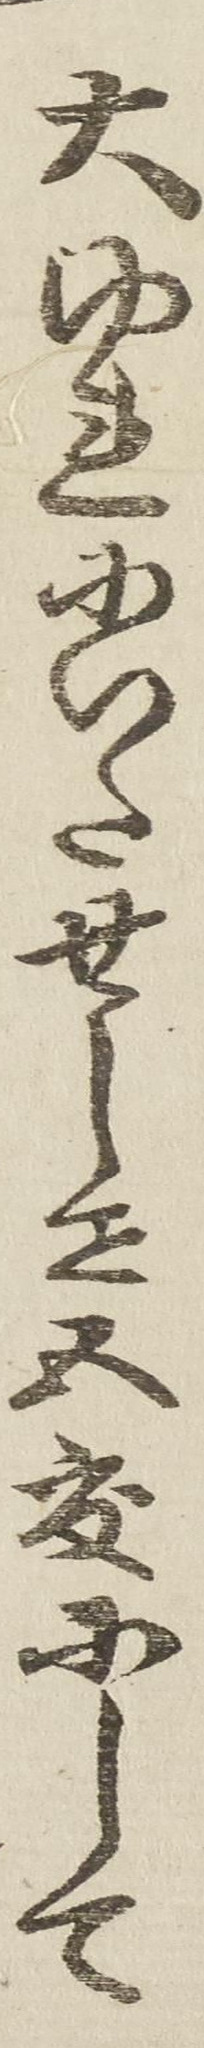大ゆれにいたせしを五度にして
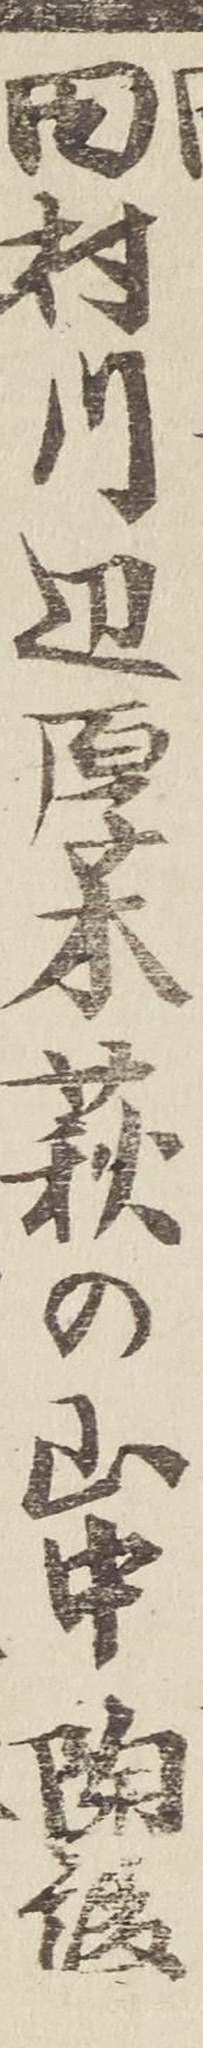田村川辺厚木萩の山中陶綾
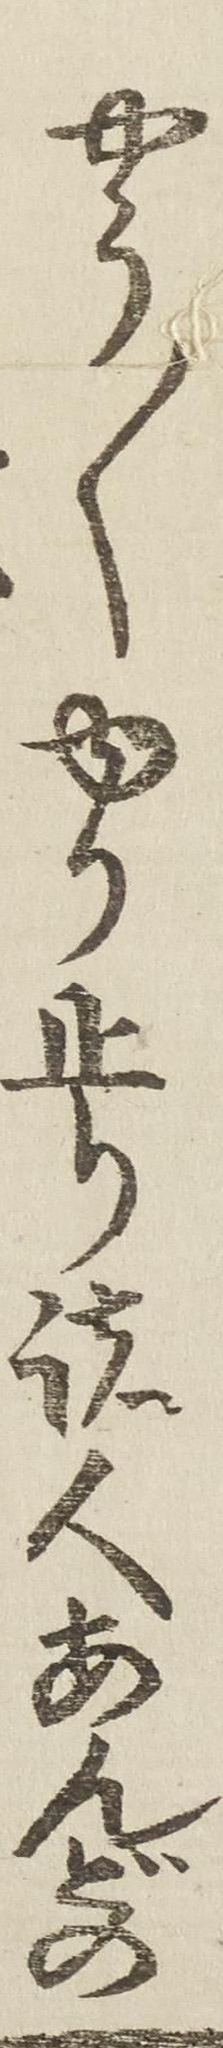やう〳〵ゆり止り諸人あんどの
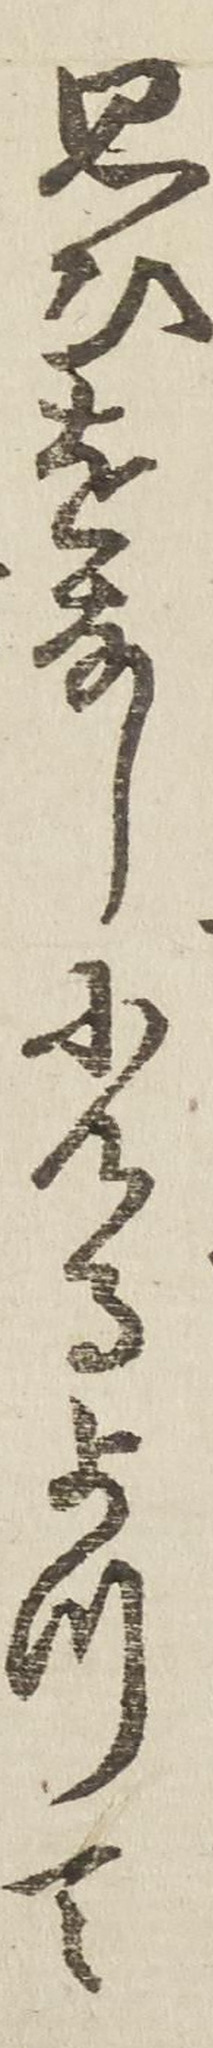思ひをなしにけるよつて
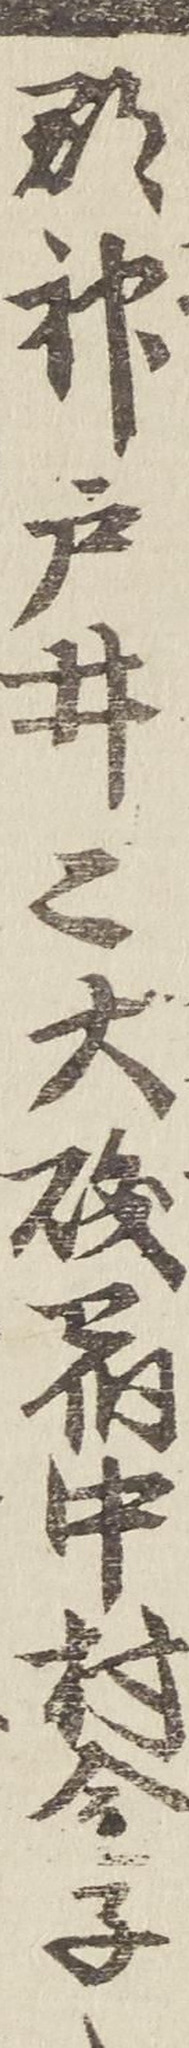郡神戸井こ大磯宿中村金子
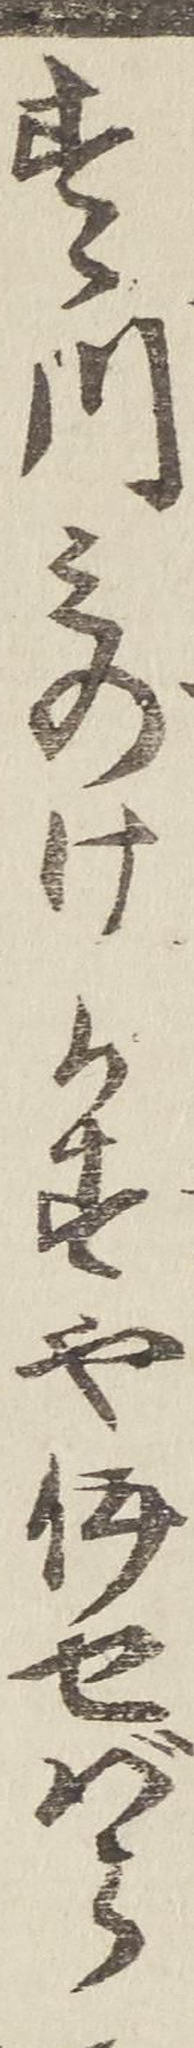すゝ川みのけかすや伊せばら
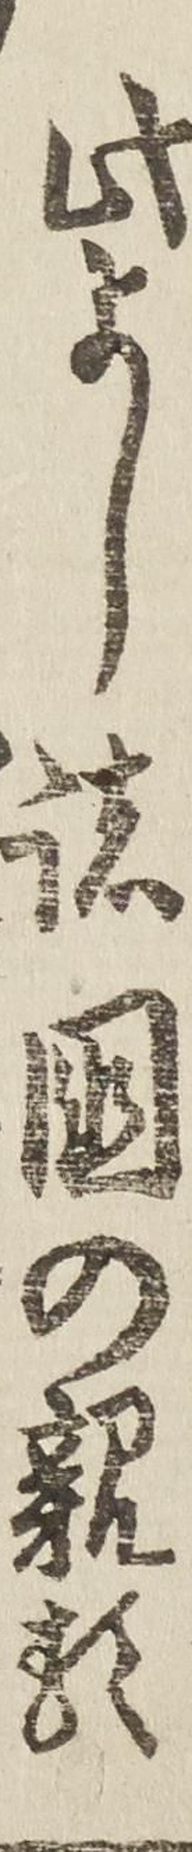此よし諸国の親類
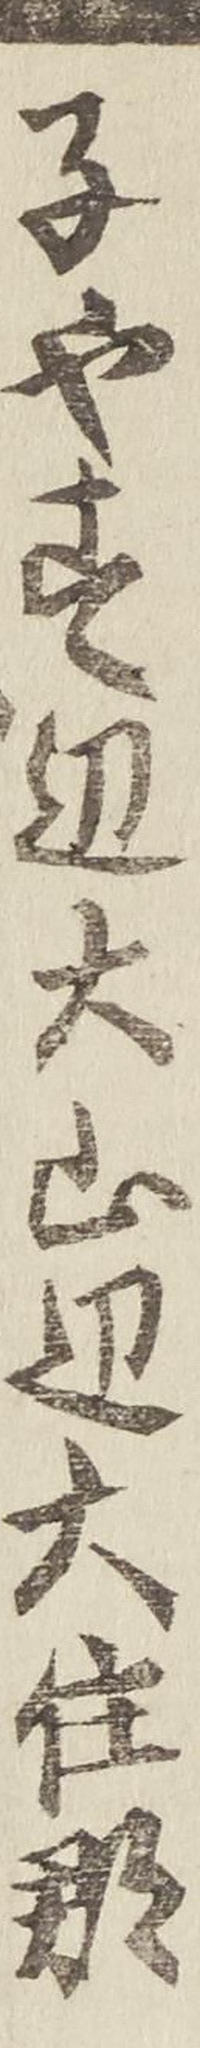子やす辺大山辺大住郡
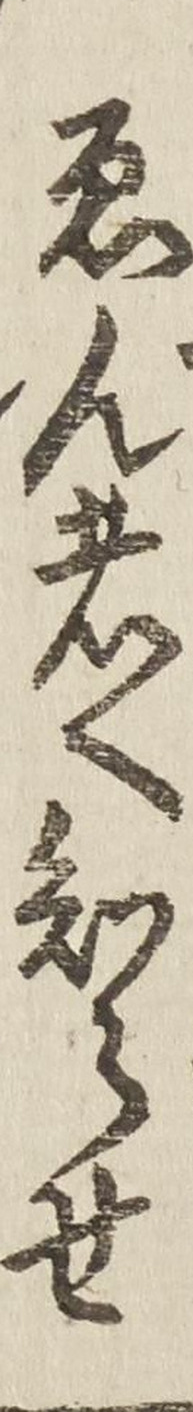ゑん者へ知らせ
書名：相模國大地震
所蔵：東京大学地震研究所図書室 Earthquake Research Institute Library, The University of Tokyo, JAPAN
